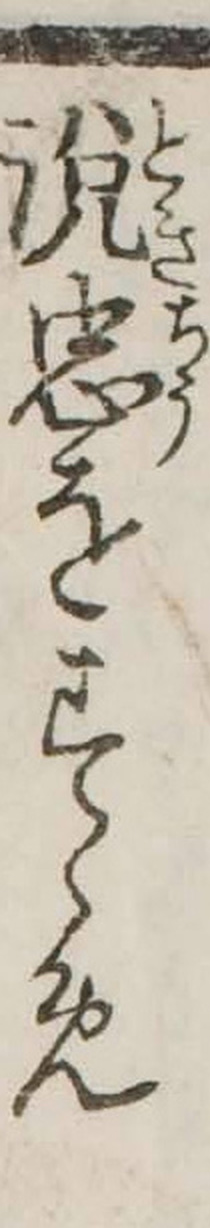説忠をすゝめ
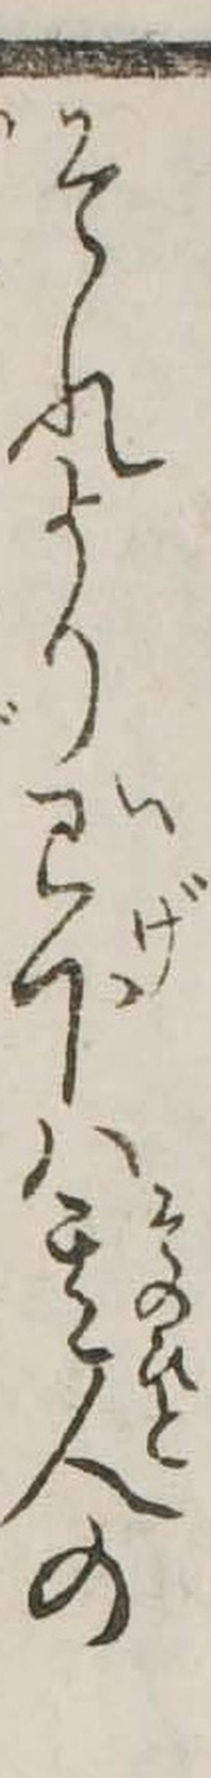それより已下は其人の
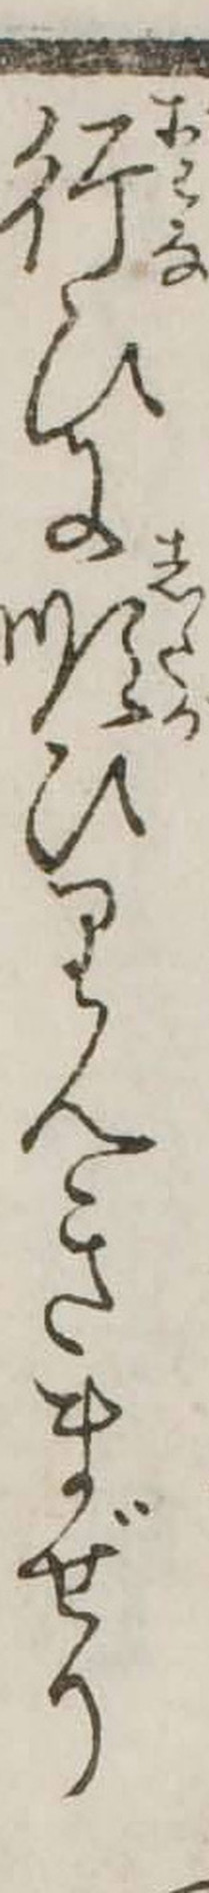行ひに順ひりんきまぜり
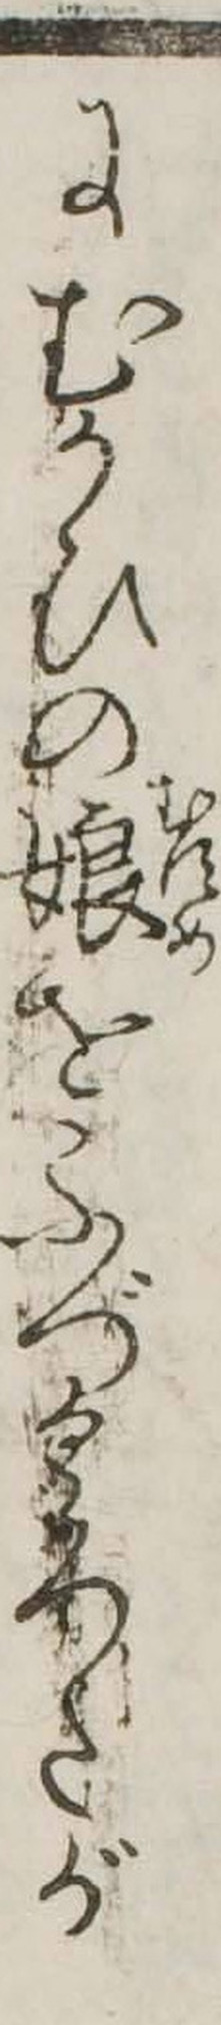にむかひの娘をふづくつたが
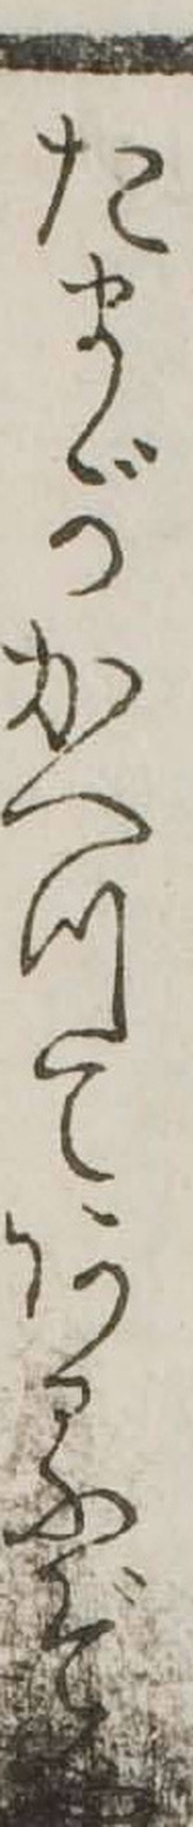たまがかへつてあるぞ
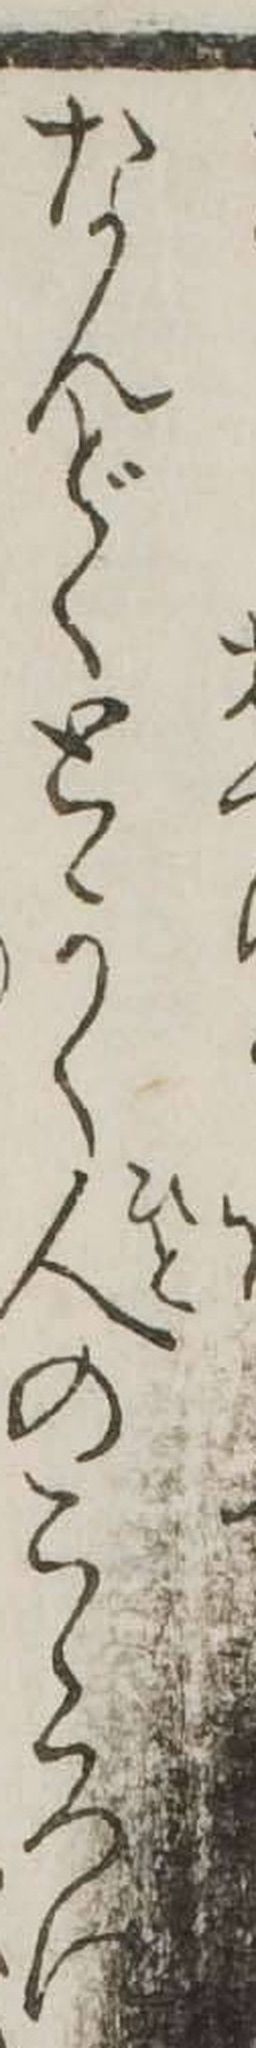なんどゝとかく人のこゝろに
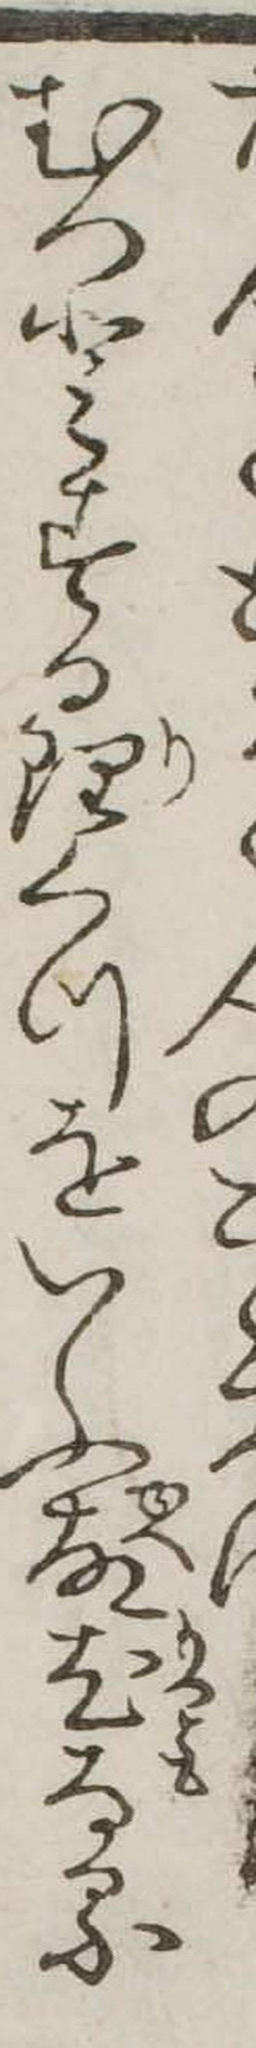むつとする理くつをいふ故尤なる
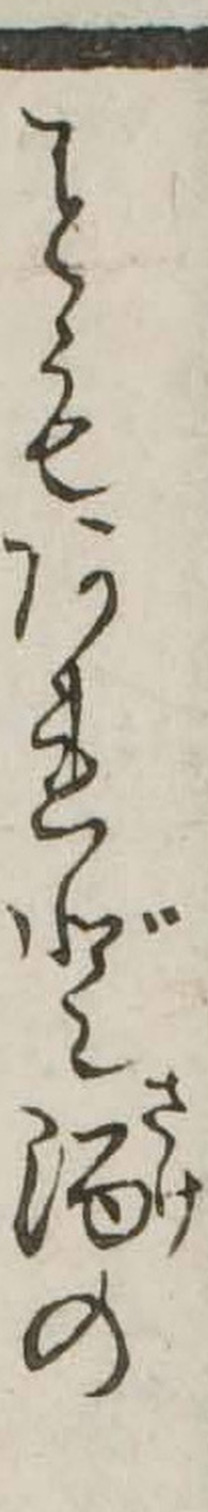こともあれど酒の
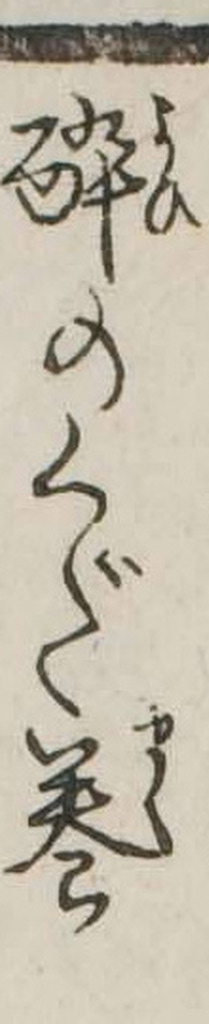酔のくだ巻
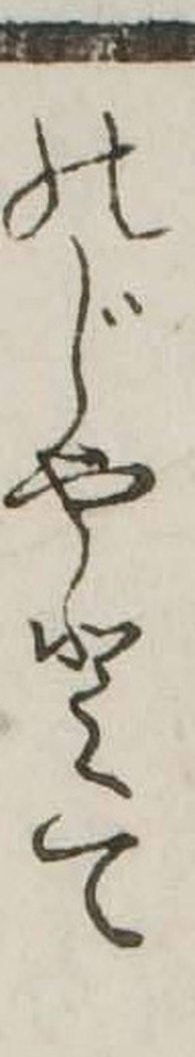のじやとて
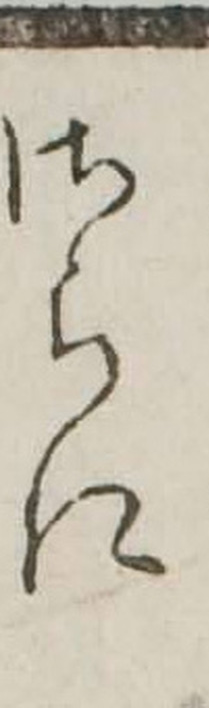さらに
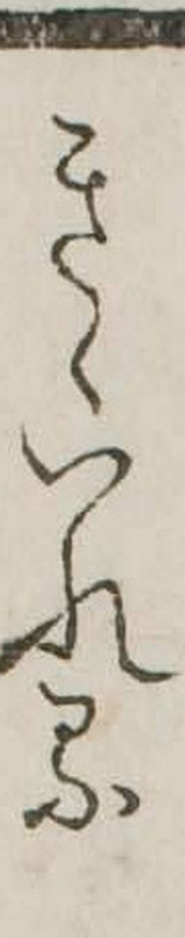きゝいれる

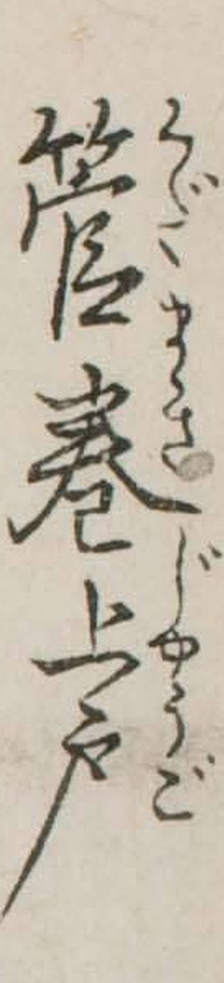管巻上戸
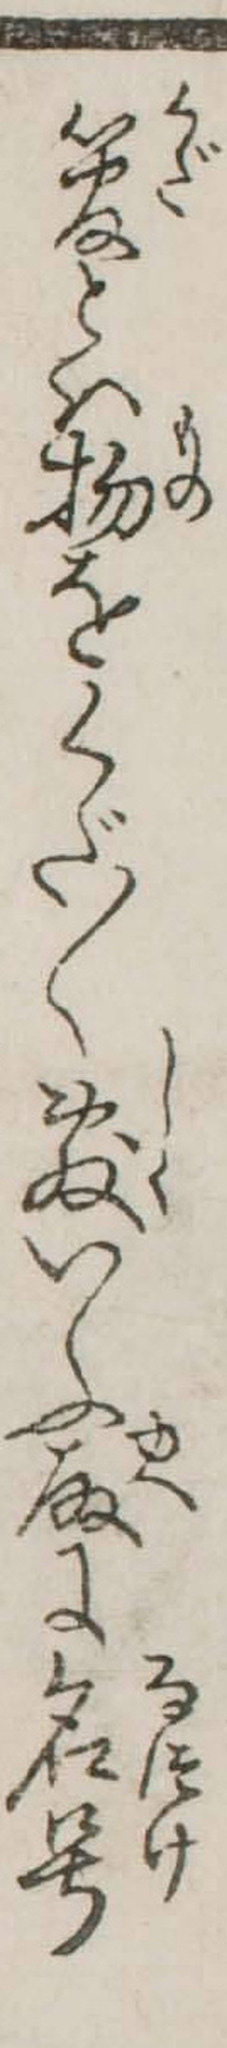管とは物をくだ〳〵敷いふ故に名号
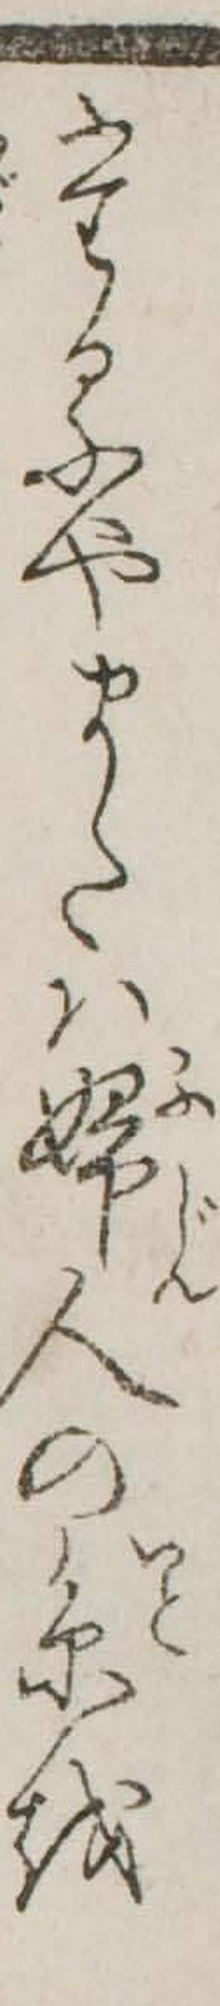たるやまたは婦人の糸を
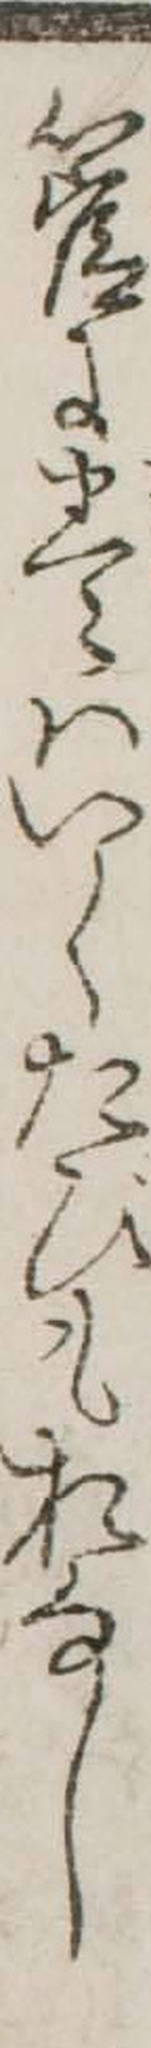管に巻はいくたびもおなし
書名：繪本不盡泉
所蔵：国文学研究資料館
